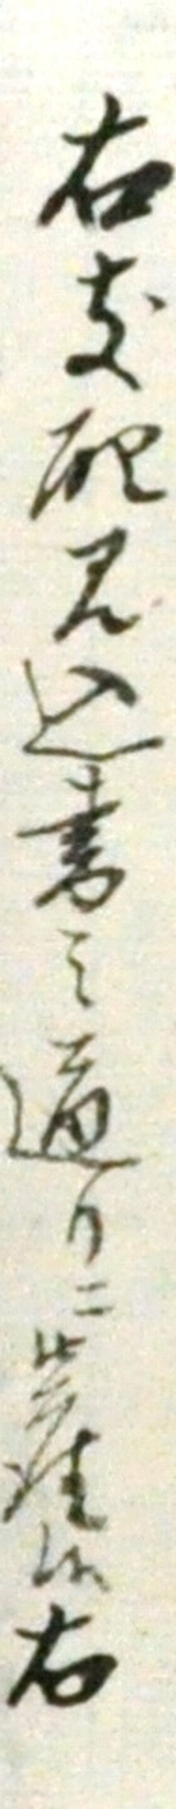右支配見込書之通りに御座候右
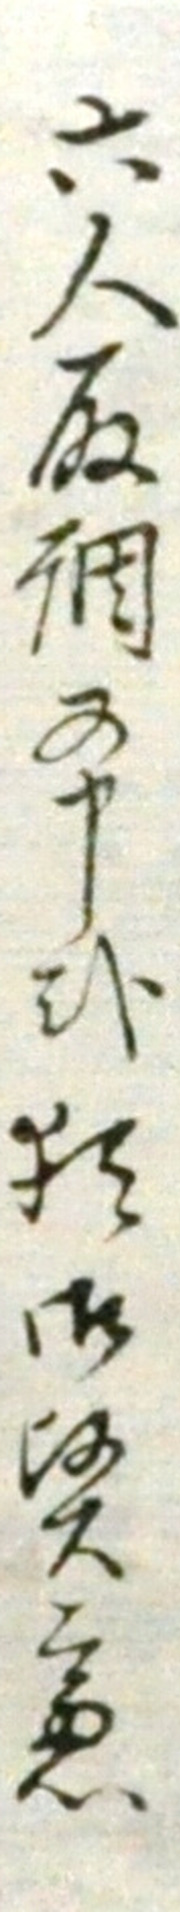六人取調可申哉猶御賢慮
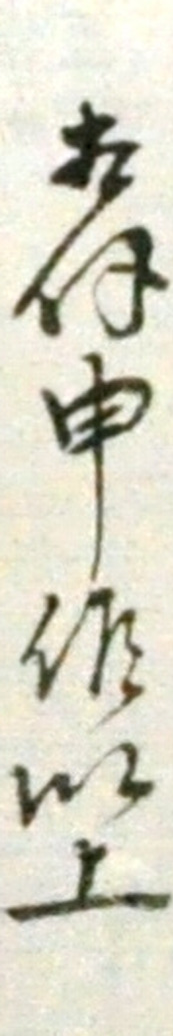相伺申候以上
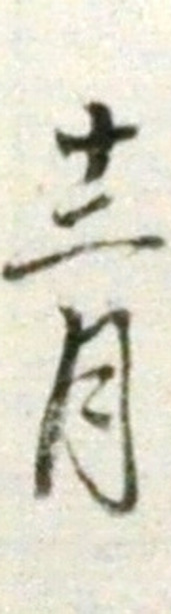十二月

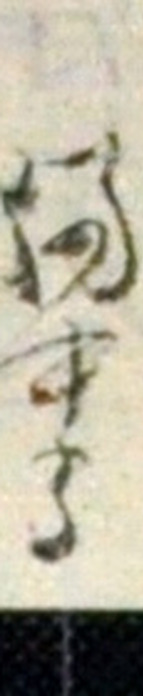備後守
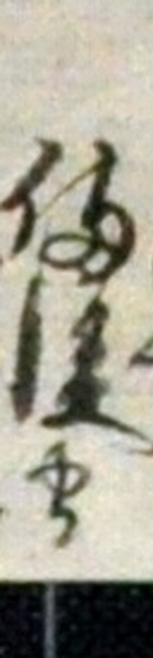備後守
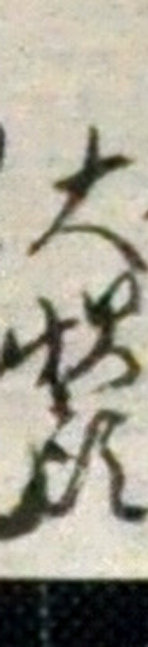大炊頭
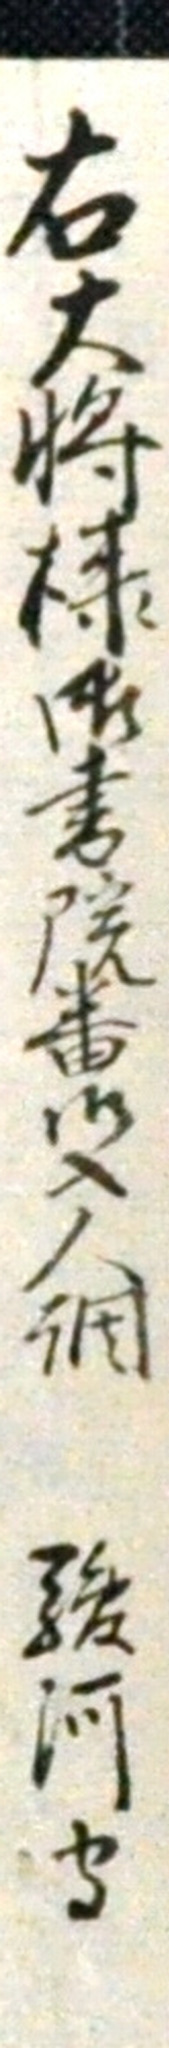右大将様御書院番御入人調駿河守
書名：右大将様御書院番御入人調
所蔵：伊那市立高遠町図書館・合同会社AMANE
